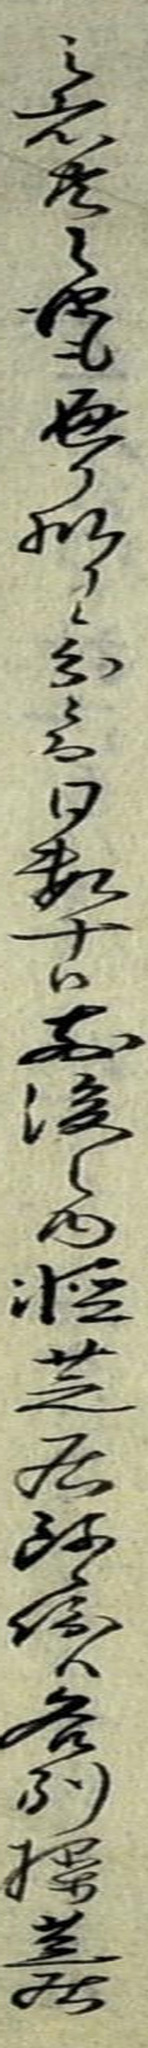之者共之儀も通り掛り候分ニ而日数十日前後之内軽芝居致候儀ハ各別操芝居
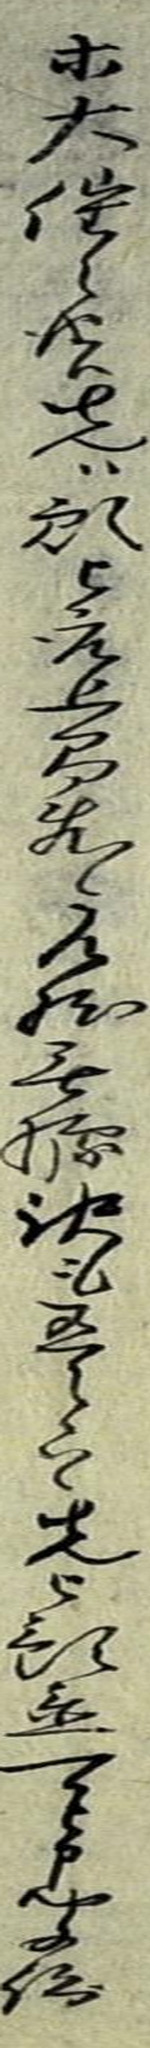等大催の之儀ハ先ハ願被取上間敷候乍然無拠訳も有之候ハヽ先被預置可被申聞儀
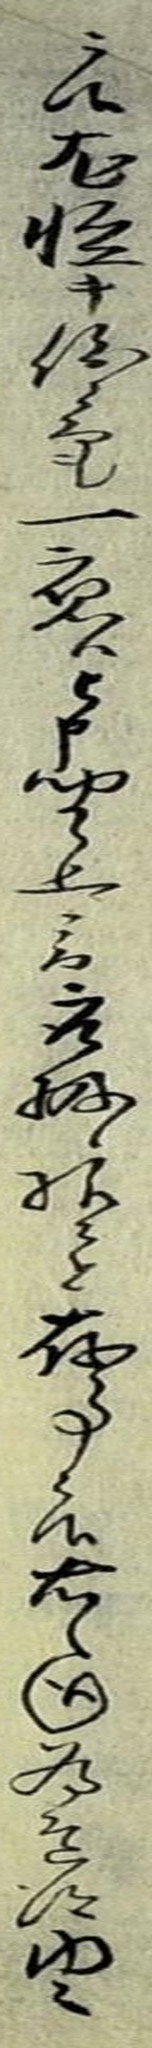ニ候尤軽キ儀ニ而も一応ハ被申聞候上ニ而取扱候様ニと存事ニ候右之趣為意得内々
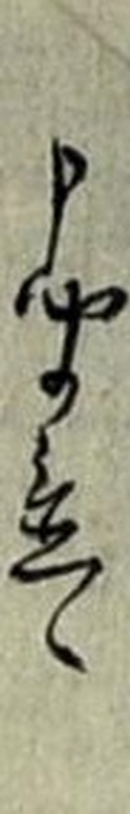申聞置候
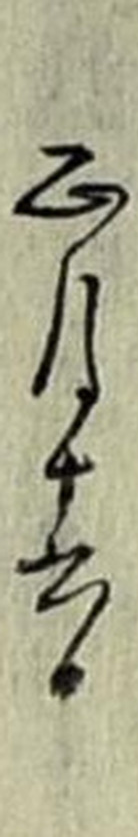正月十六日
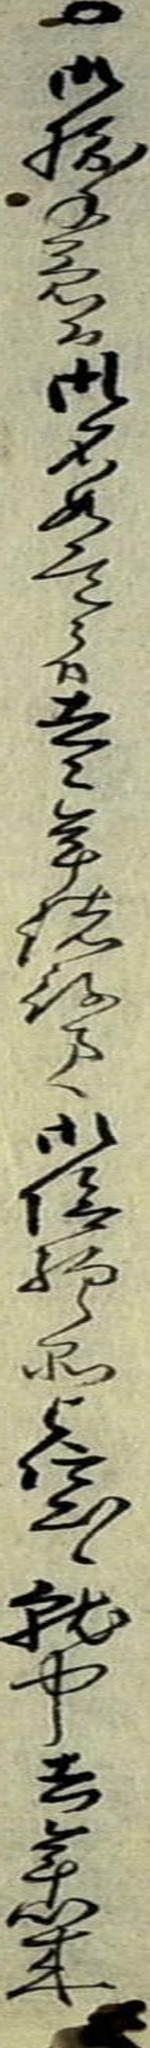○御勝手兼而御不如意ニ付去々年諸役方へ御倹約之品被仰出候就中去年以来
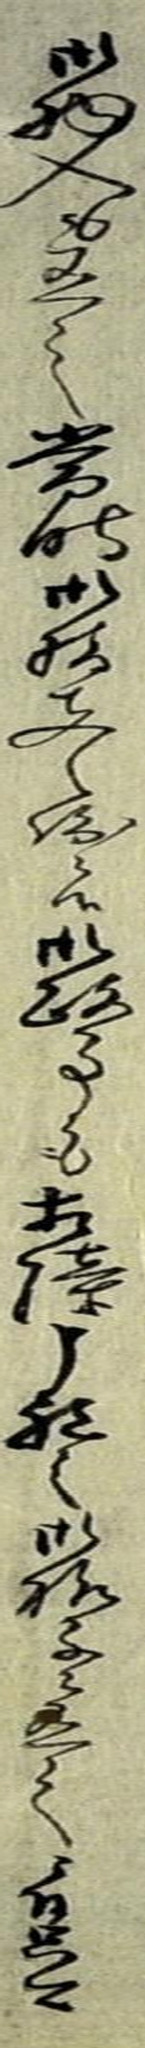御物入も有之当時御指支之儀ニ候御政事ニも相障申程之御様子ニ有之ニ付只今
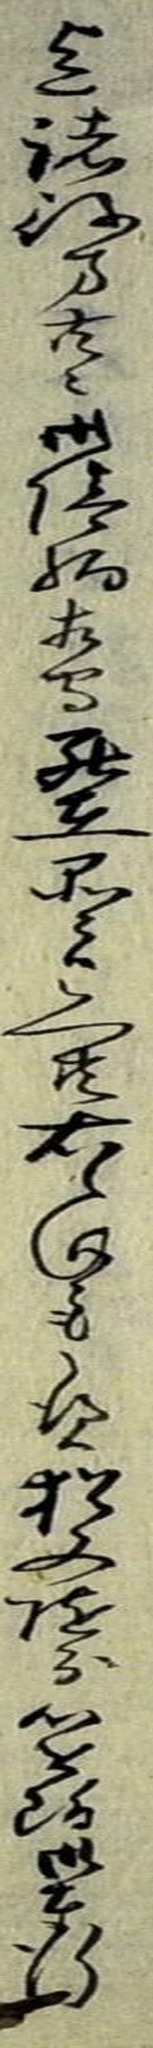迄諸役方共ニ御倹約相守罷在品ニハ候へ共右之趣にも候得ハ猶又随分心を附御奉行
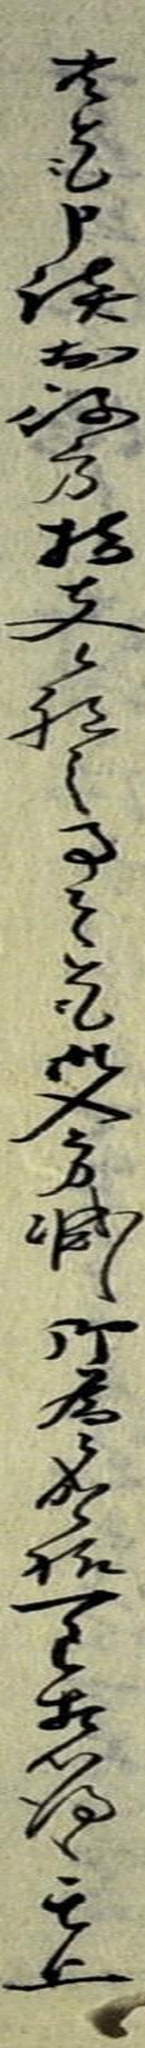共とも申談於役方指支候程之事ニ候とも御入方減候御為ニ成候様可被相心得候其上
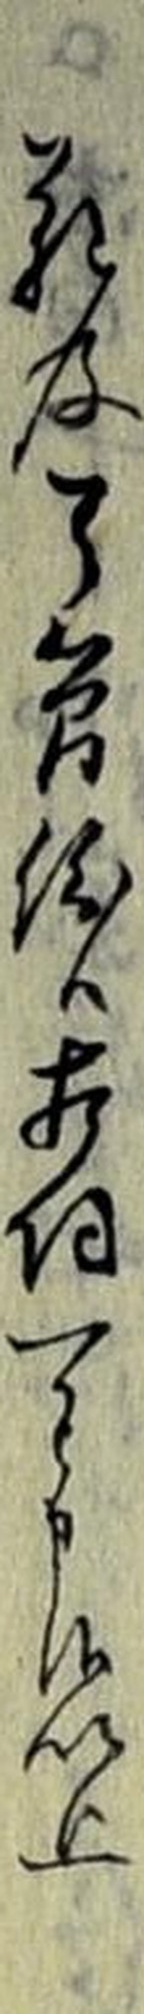難及了簡儀ハ相伺可被申候以上
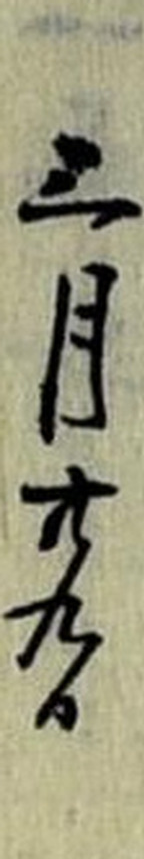三月廿九日
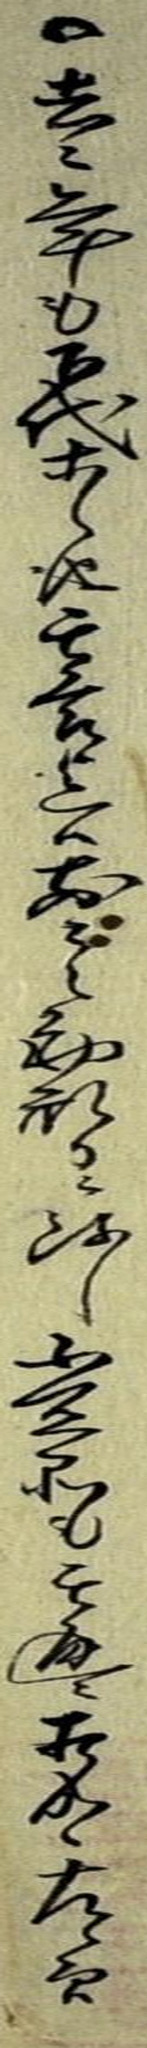○去々年も下代等之儀其節迄ハ前々之勤形りニ致し不宜品も其通ニ相成候左候而ハ
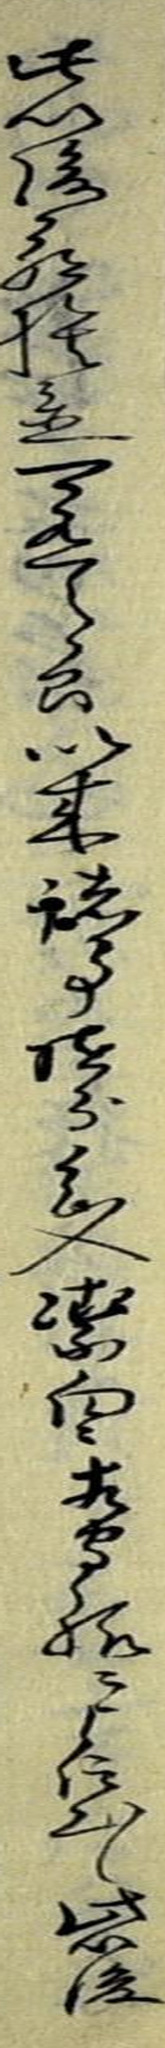此以後難捨置可有之候間以来諸事随分念入潔白ニ相守候様ニ被仰出候此以後
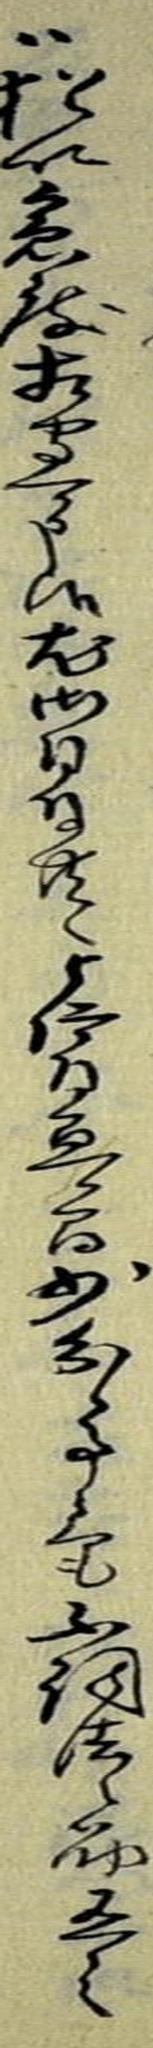ハ猶以急度相守可申候尤御目付共へ被仰付置候間少分之事ニ而も不調法之筋有之
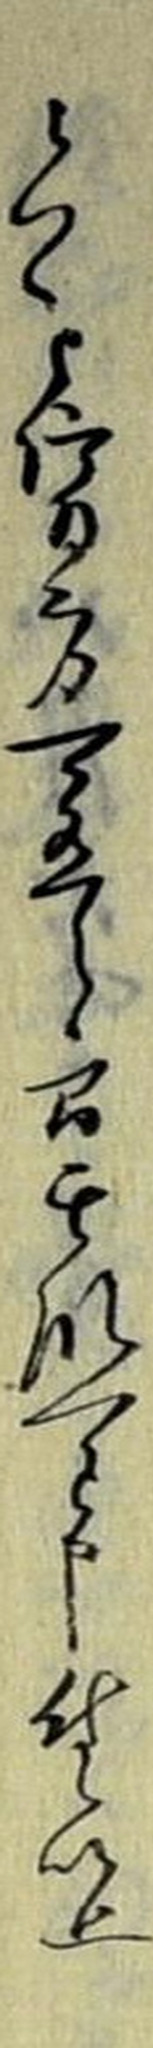候ハヽ被仰付方可有之候間其段可被申付候以上
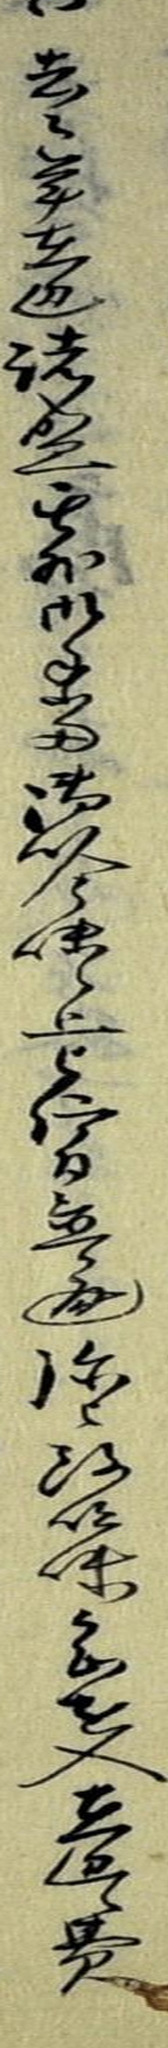○去々年在辺諸盛其外御手当御吟味之上被仰付置候通弥被致吟味念を入在辺へ費
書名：命令之部 二
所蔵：福井県文書館 Fukui Prefectural Archives
